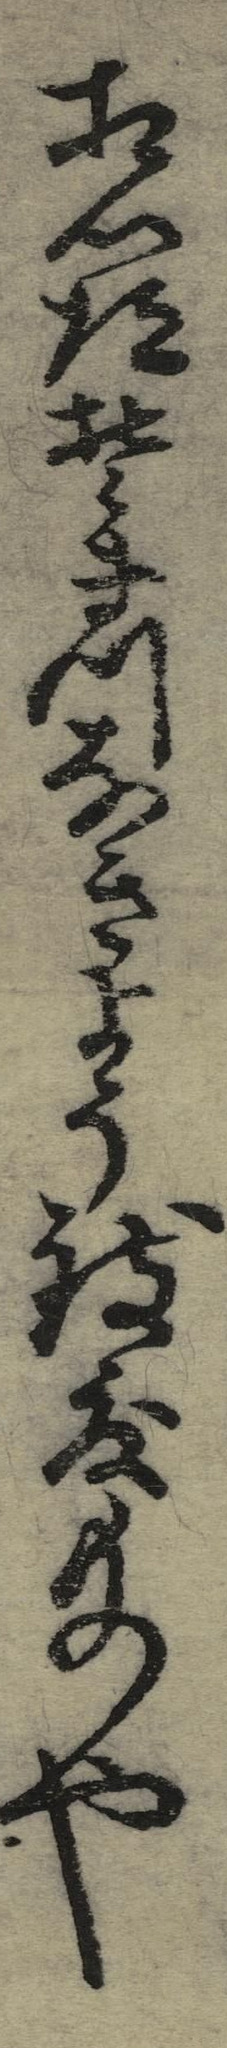相心得そまつなきよう致度もの也
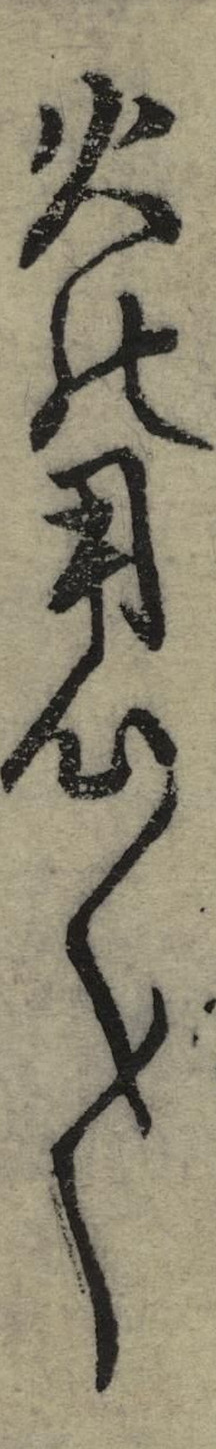火の用心〳〵〳〵
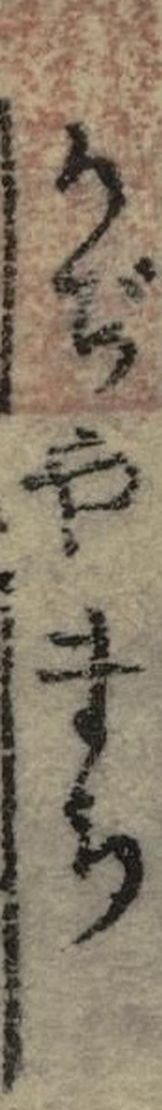かぢやまち
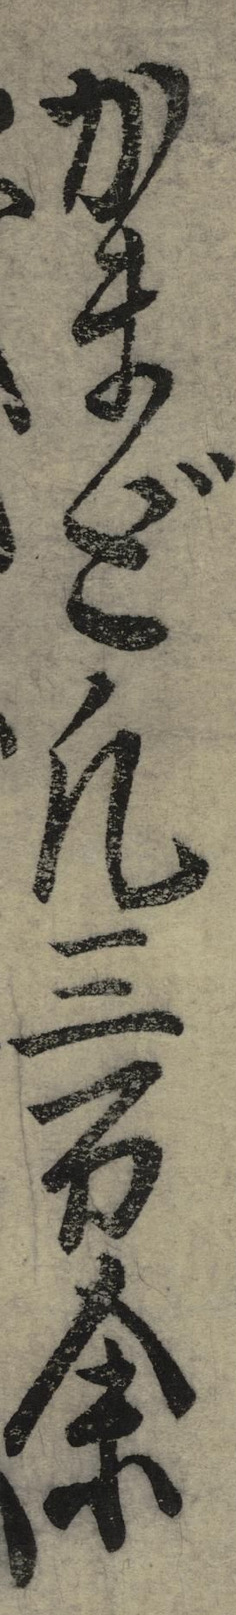かまど凡三万余
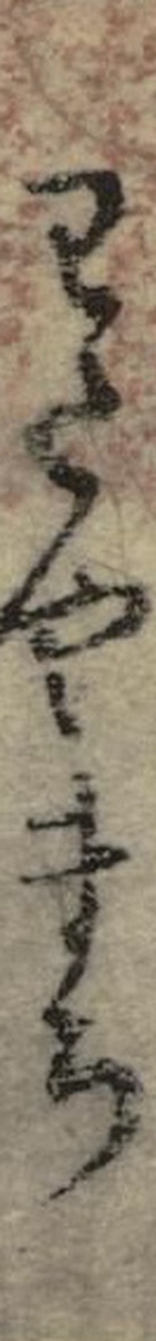かぢやまち
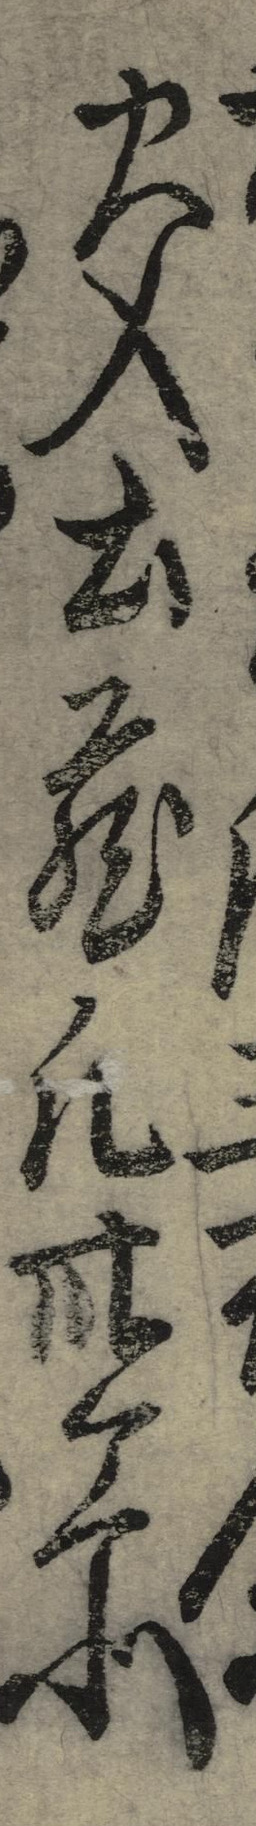火入土蔵凡卅ケ所
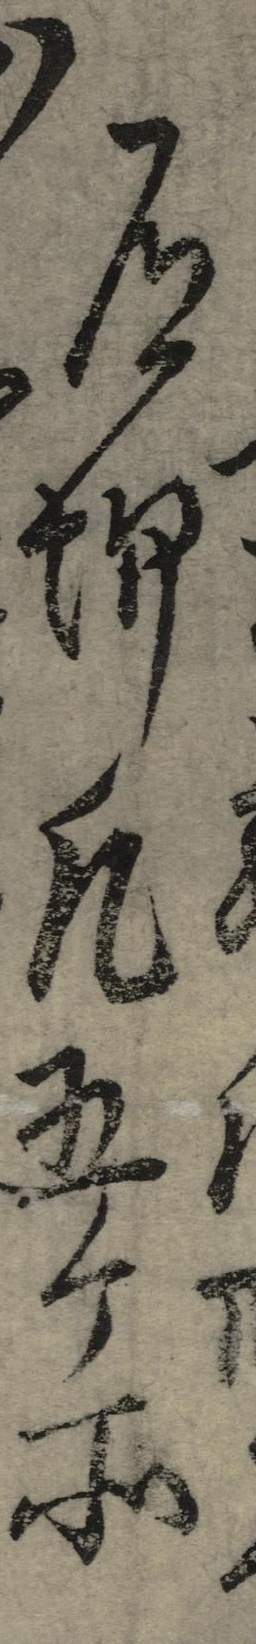道場凡五ケ所
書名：大阪大火
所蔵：東京大学地震研究所図書室 Earthquake Research Institute Library, The University of Tokyo, JAPAN
